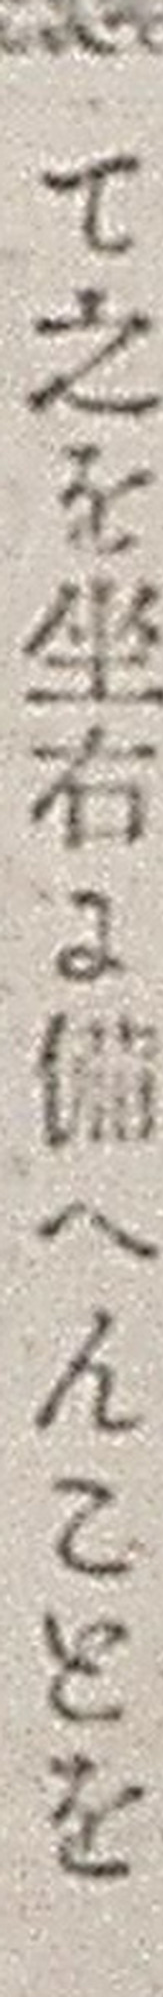て之を座右に備へんことを
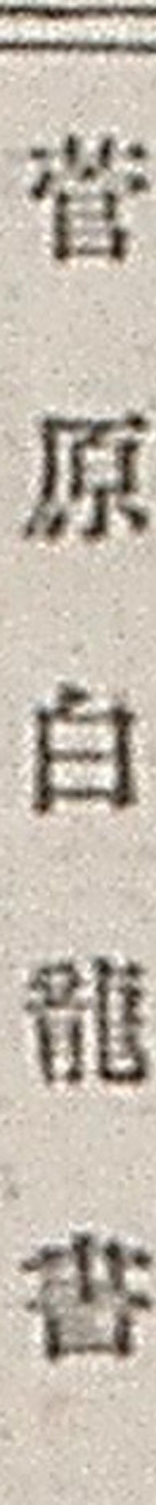菅原白龍書
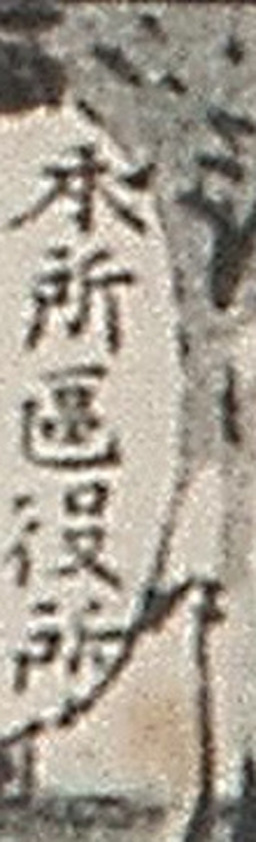本所区役所
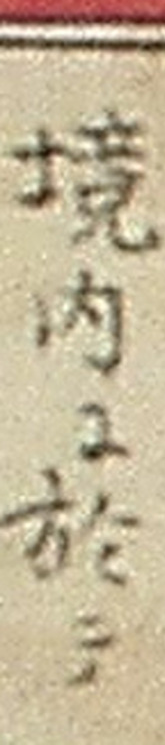境内に於て
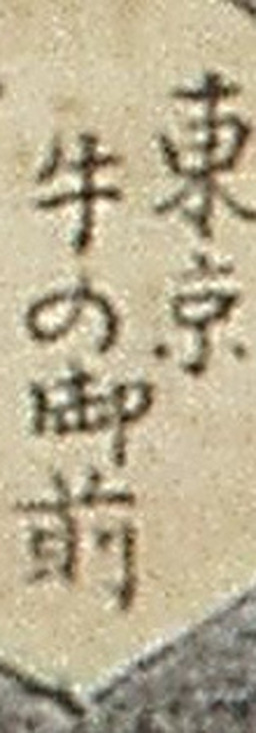牛の御前
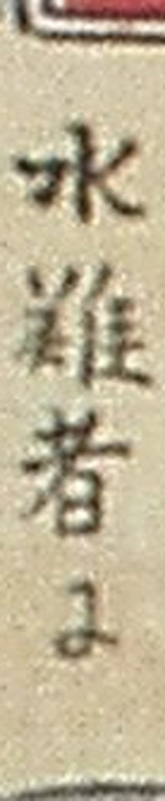水難者に
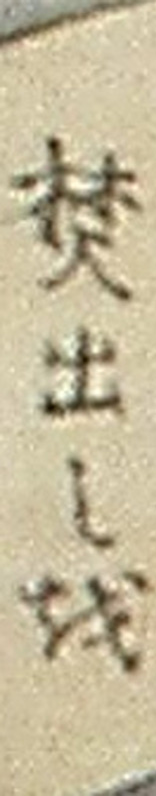焚出しを
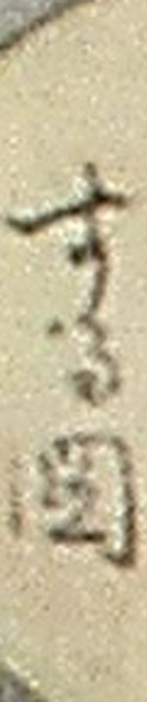する図
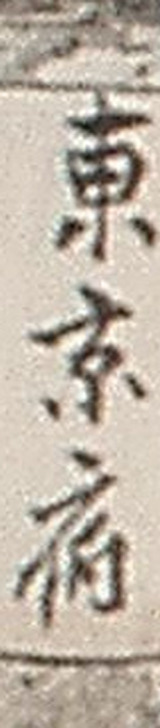東京府

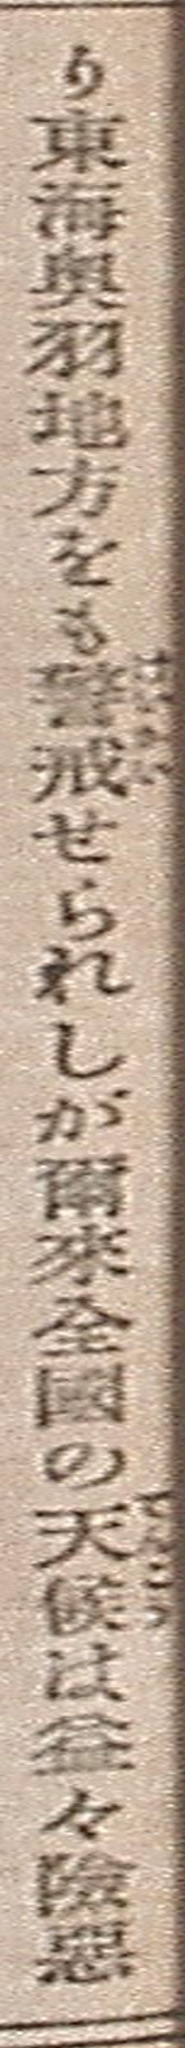り東海奥羽地方をも警戒せられしが爾来全国の天候は益々険悪
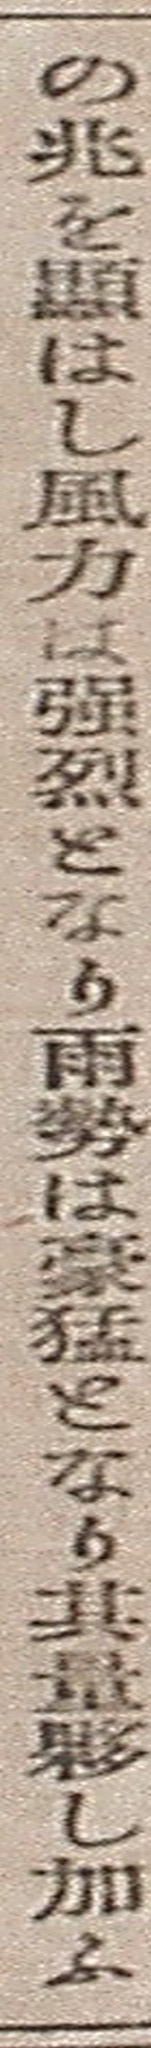の兆を顕はし風力は強烈となり雨勢は豪猛となり其量夥し加ふ
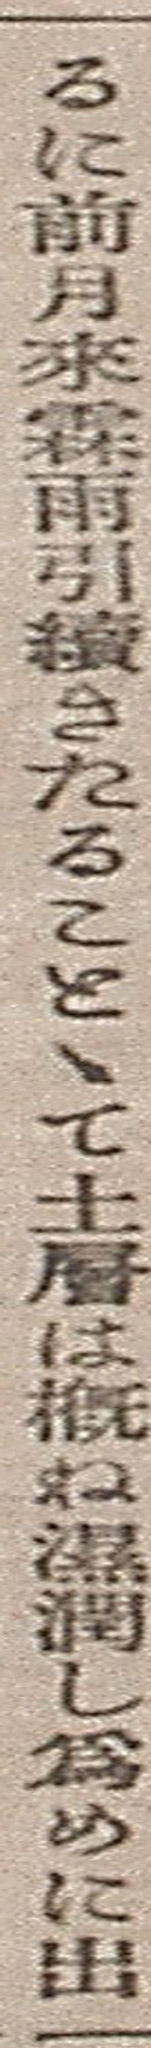るに前月来霖雨引続きたることゝて土層は概ね湿潤し為めに出
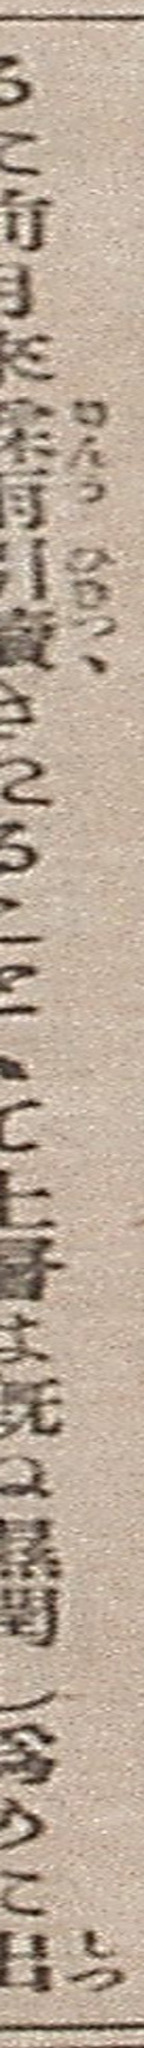るに前月来霖雨引続きたることゝて土層は概ね湿潤し為めに出
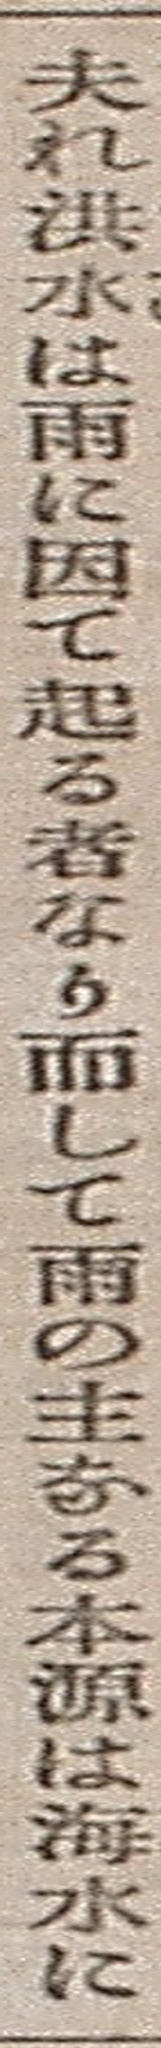夫れ洪水は雨に因て起る者なり而して雨の主なる本源は海水に
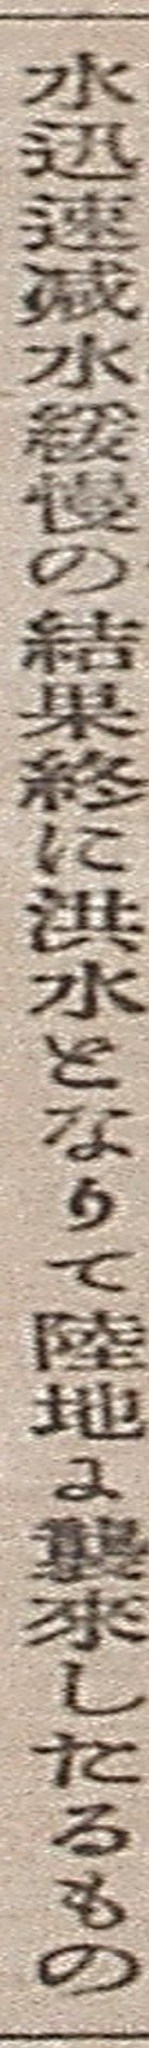水迅速減水緩慢の結果終に洪水となりて陸地に襲来したるもの
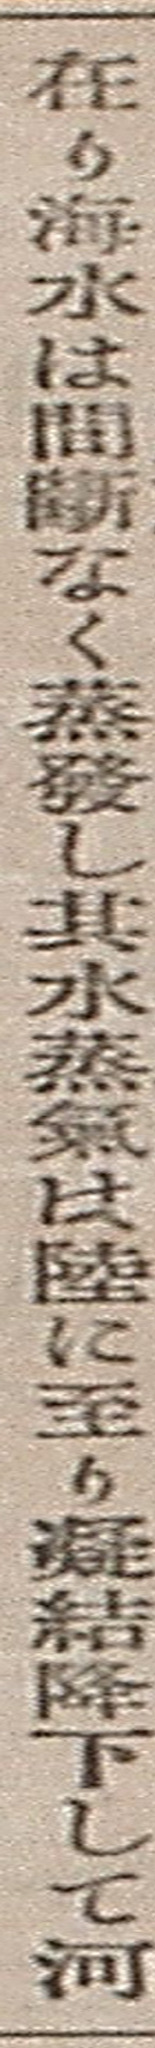在り海水は間断なく蒸発し其水蒸気は陸に至り凝結降下して河
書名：風俗畫報臨時増刊第百二十四號　洪水地震被害録（上）
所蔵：東京大学地震研究所図書室 Earthquake Research Institute Library, The University of Tokyo, JAPAN
